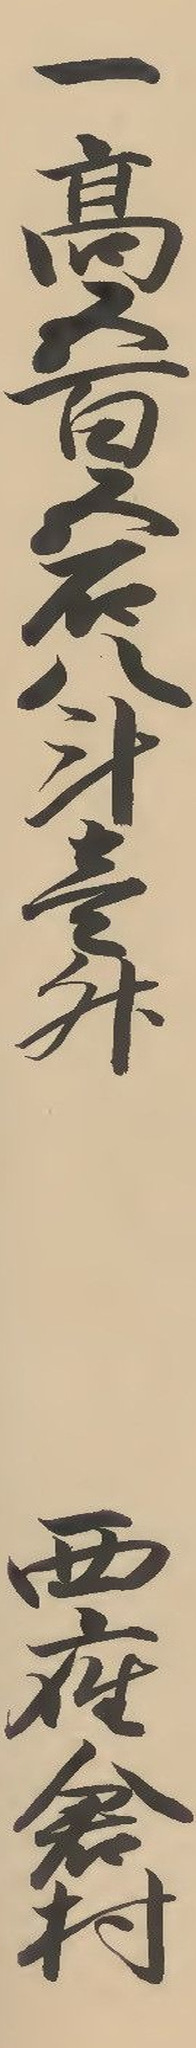一高五百五石八斗壱升西座倉村
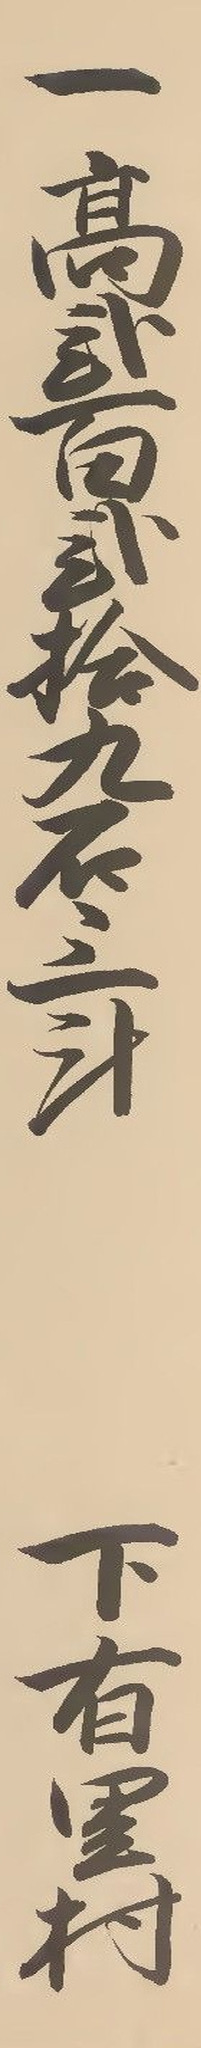一高弐百弐拾九石三斗下有里村
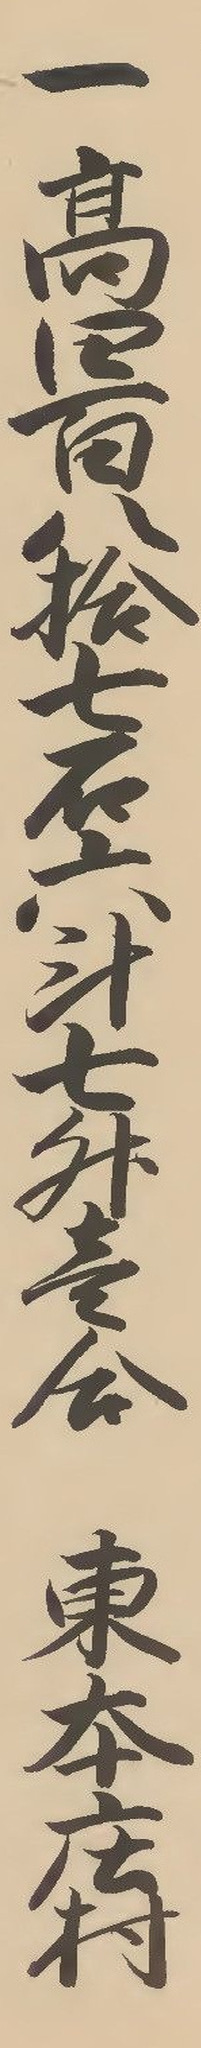一高四百八拾七石六斗七升壱合東本庄村
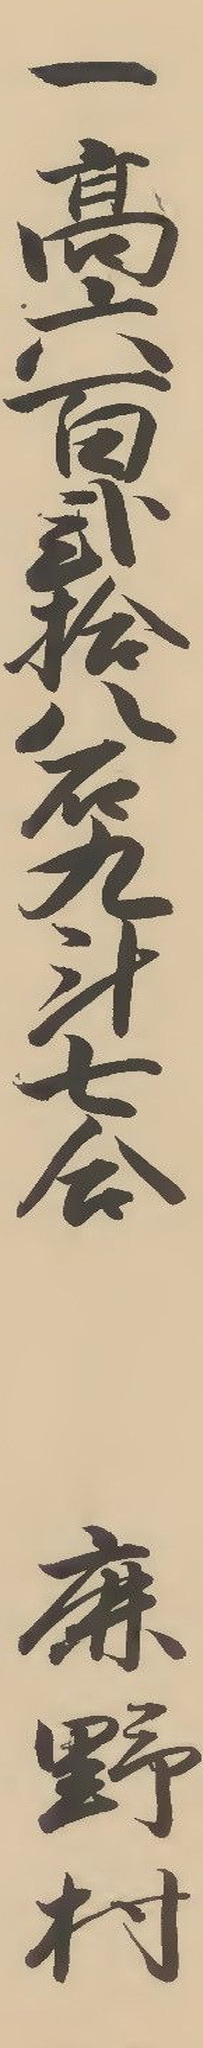一高六百弐拾八石九斗七合鹿野村
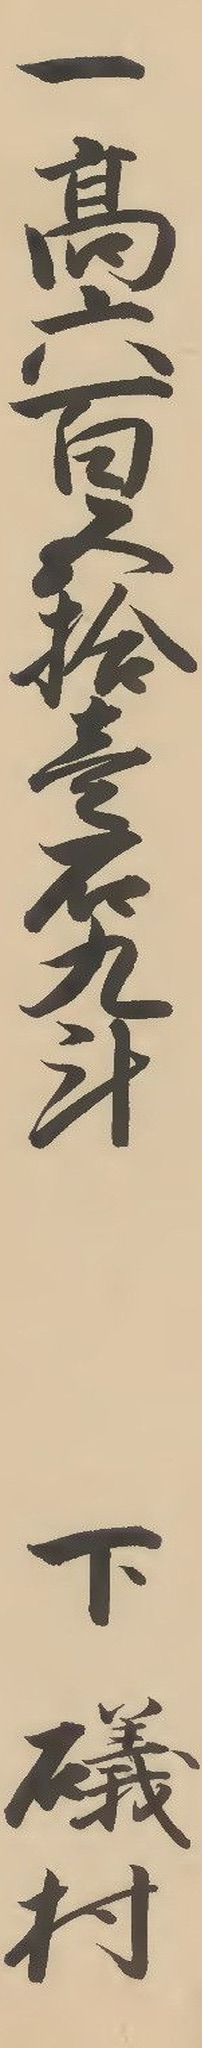一高六百五拾壱石九斗下磯村

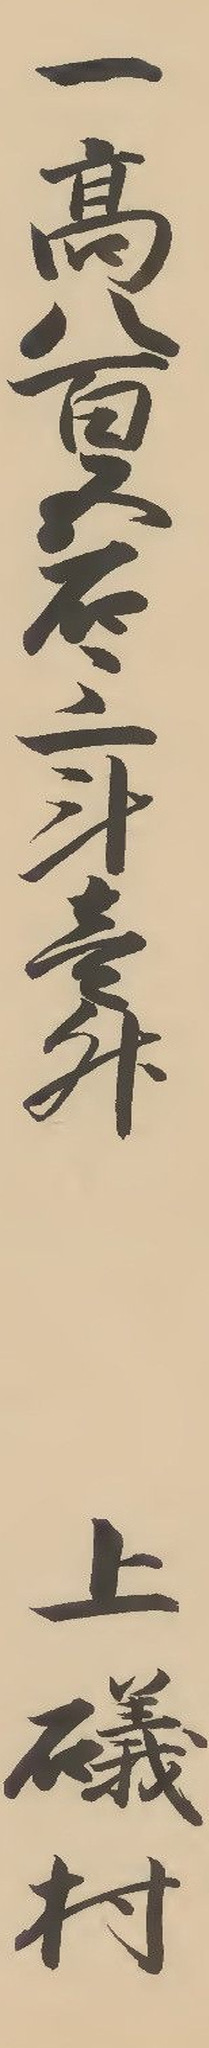一高八百五石三斗壱升上磯村
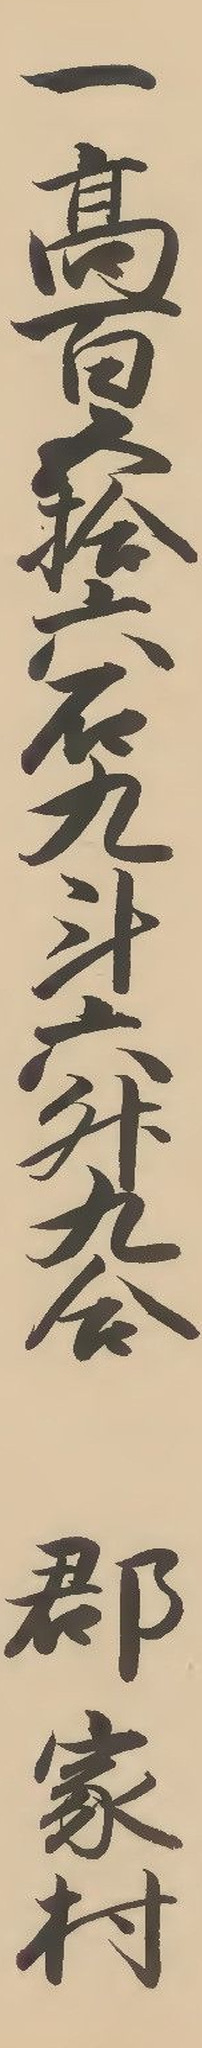一高百五拾六石九斗六升九合郡家村
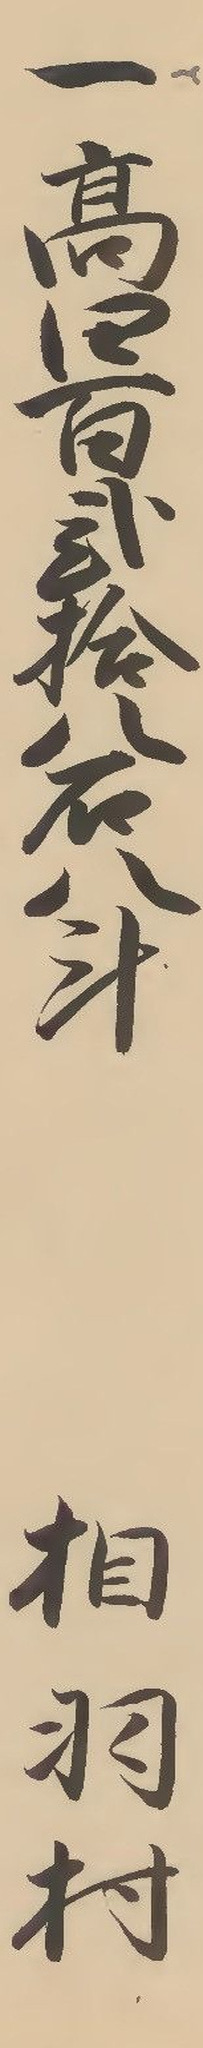一高四百弐拾八石八斗相羽村
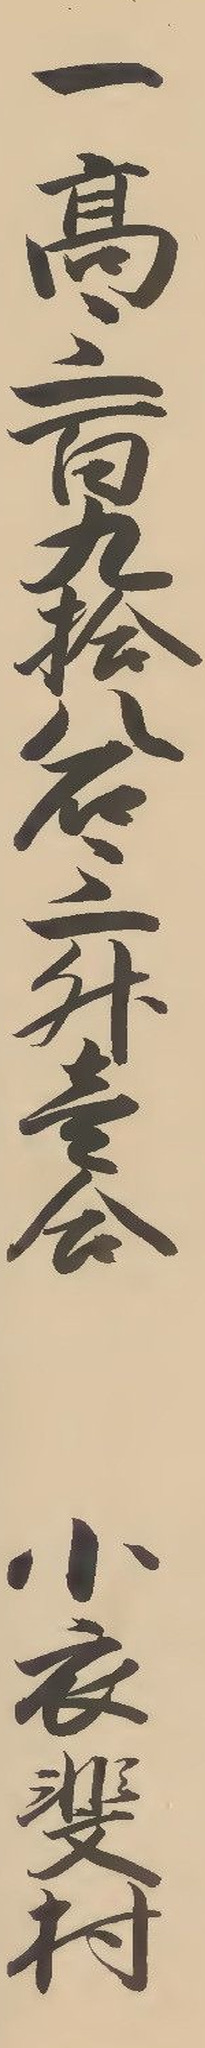一高三百九拾八石三升壱合小衣斐村
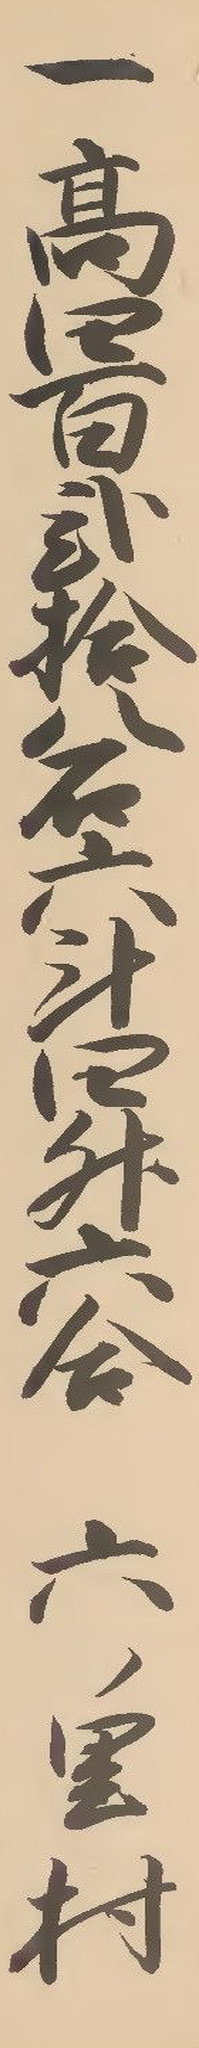一高四百弐拾八石六斗四升六合六ノ里村
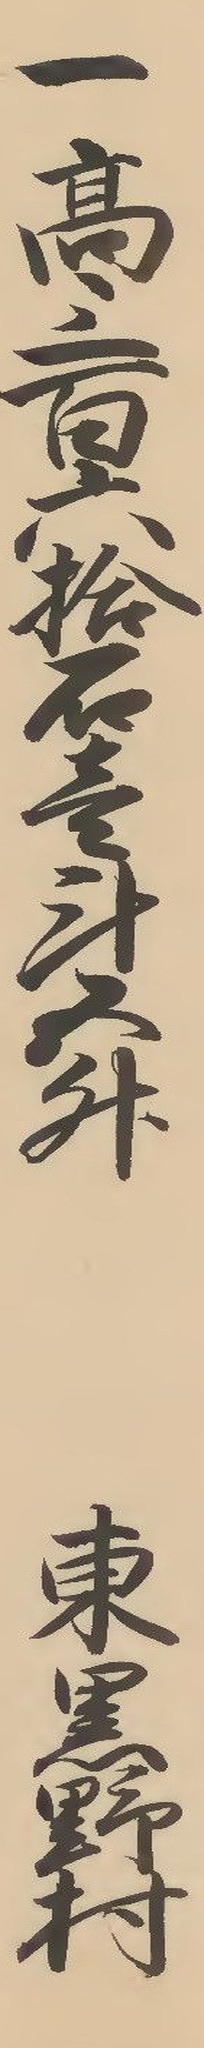一高三百六拾石壱斗五升東黒野村
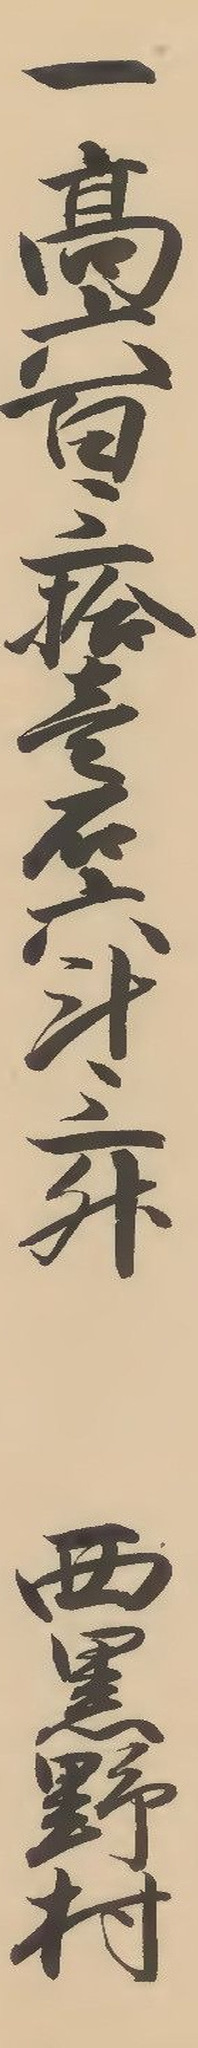一高六百三拾壱石六斗三升西黒野村
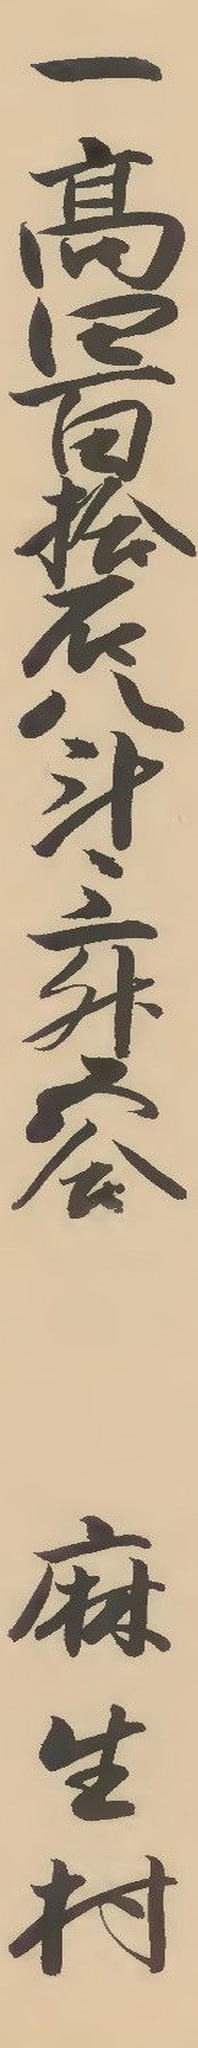一高四百拾石八斗三升五合麻生村

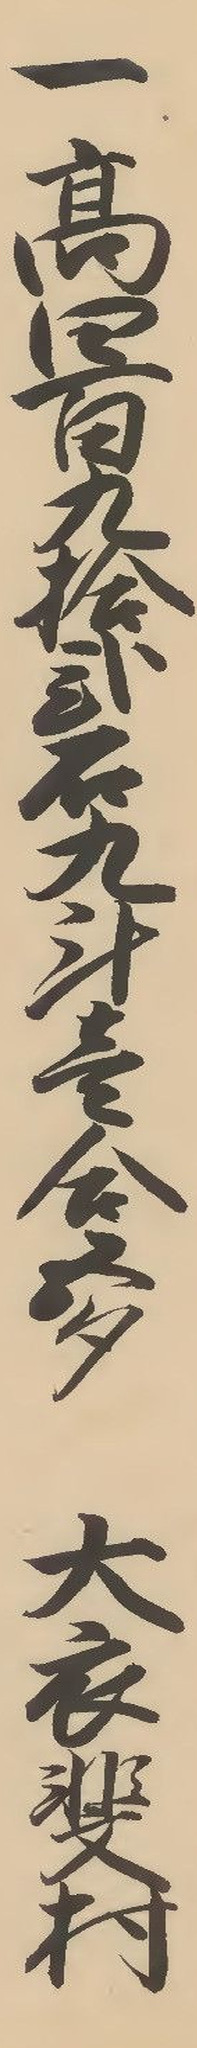一高四百九拾弐石九斗壱合五勺大衣斐村
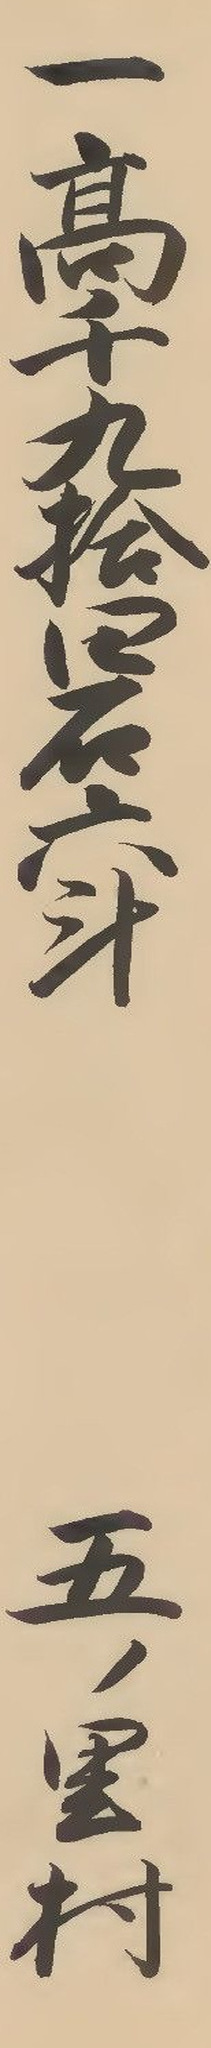一高千九拾四石六斗五ノ里村
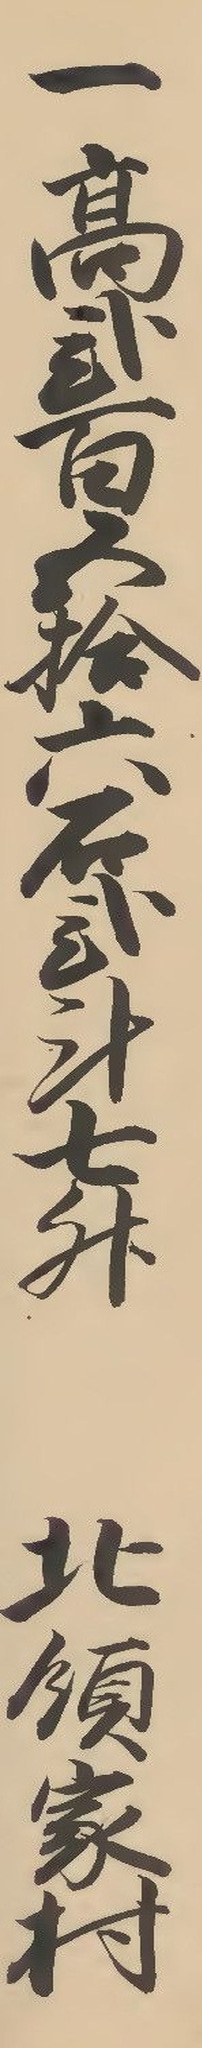一高弐百五拾六石弐斗七升北領家村
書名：美濃国郷帳
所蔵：国立公文書館 National Archives of Japan
